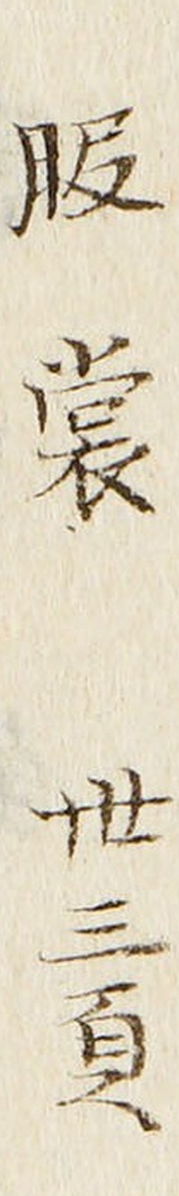服裳丗三頁
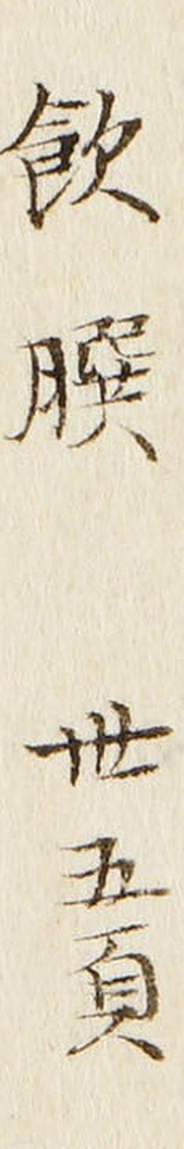飲𦠆丗五頁
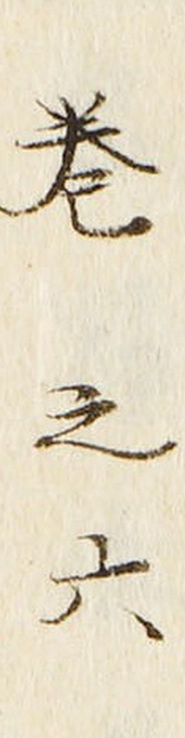巻之六
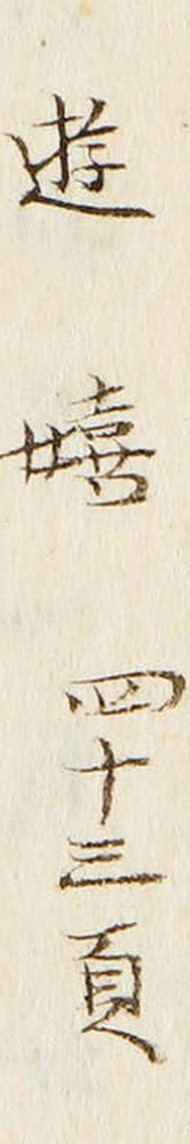逰嬉四十三頁
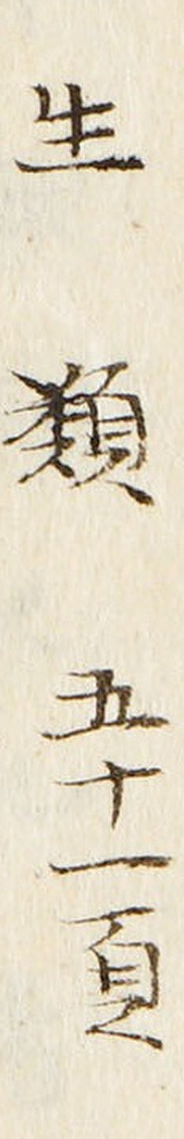生類五十一頁
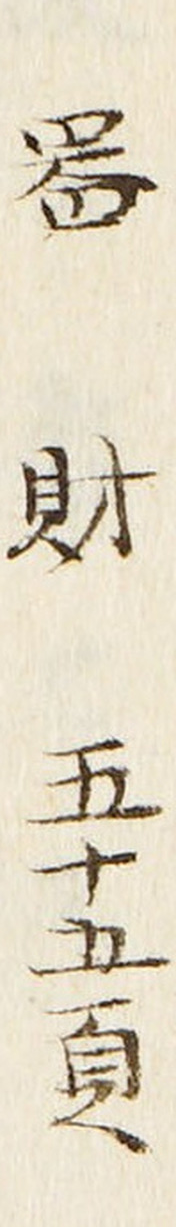器財五十五頁
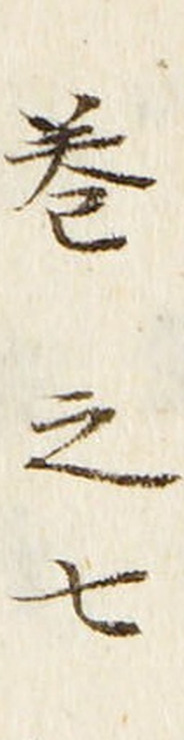巻之七
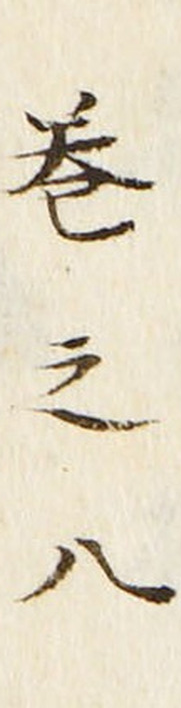巻之八
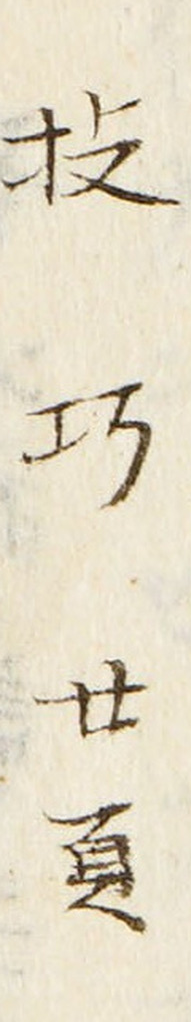技巧廿頁
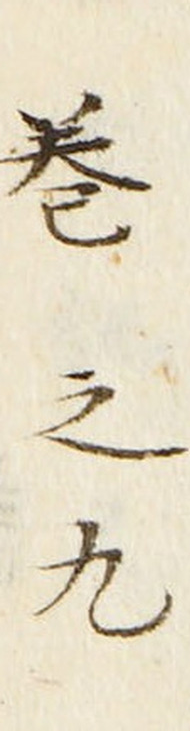巻之九
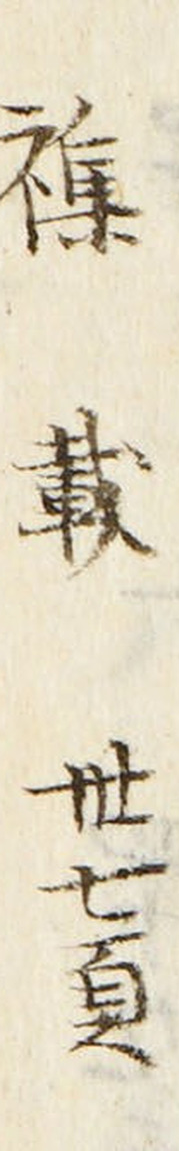襍載丗七頁

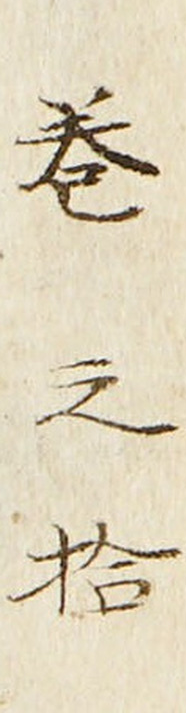巻之拾
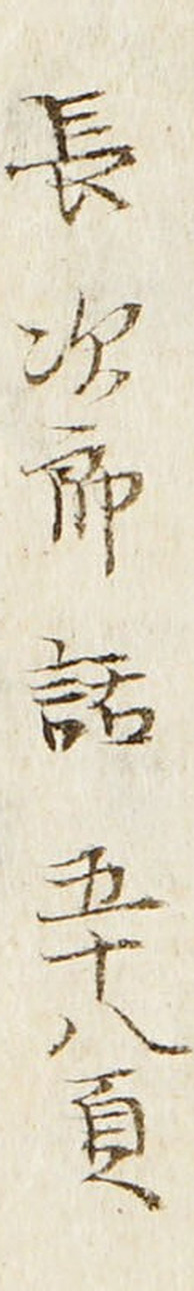長次郎話五十八頁
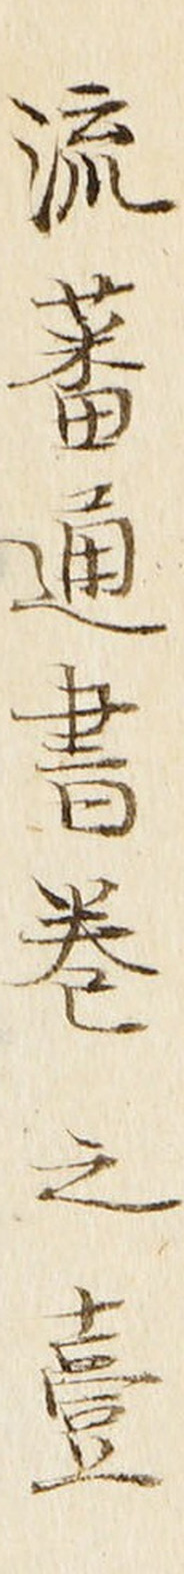流蕃通書之壹
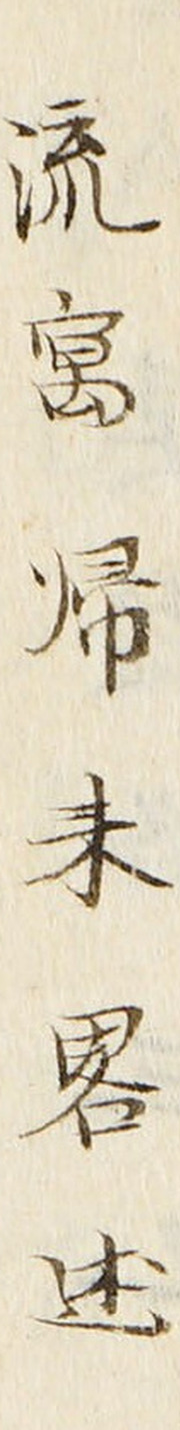流寓帰来略述
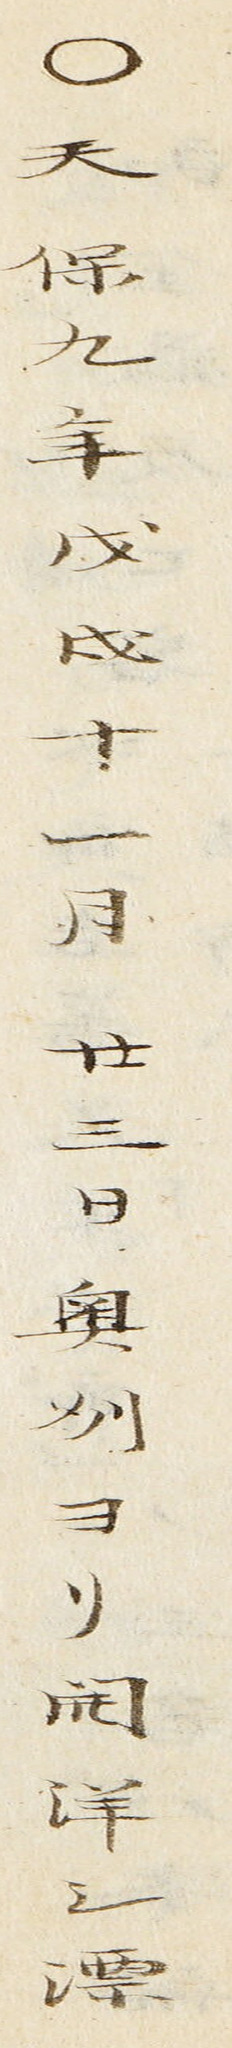○天保九年戊戌十一月廿三日奥州ヨリ開洋シ漂
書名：流蕃通書
